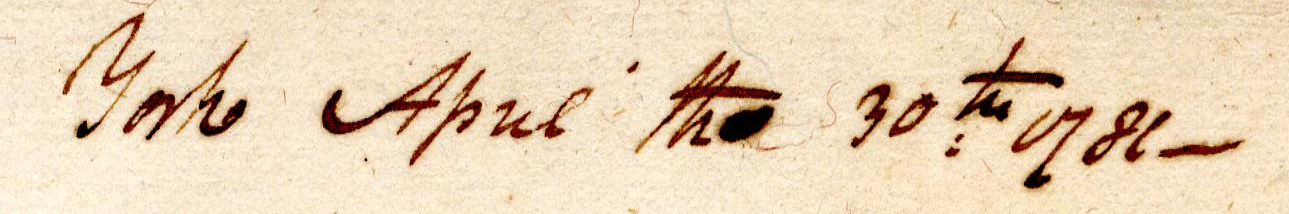York April the 30^th. 1781
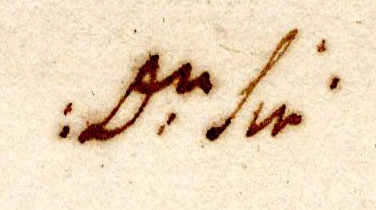D^r. Sir
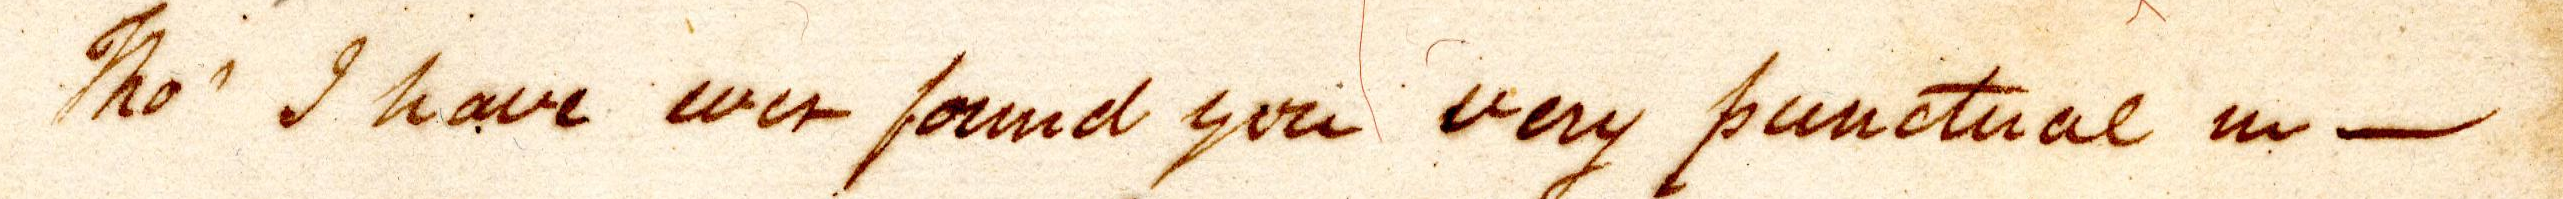Tho^s I have ever found you very punctual in
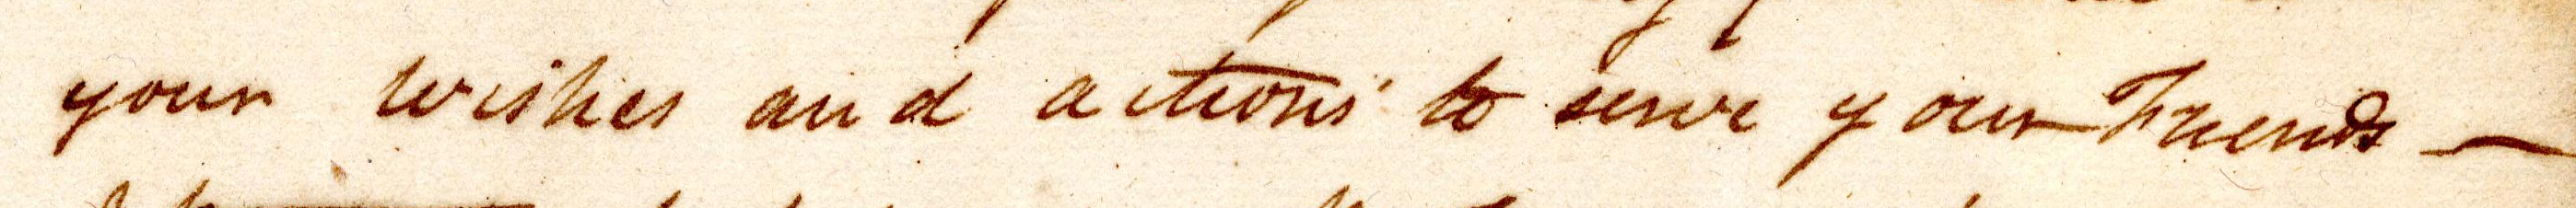your wishes and actions to serve your Friends
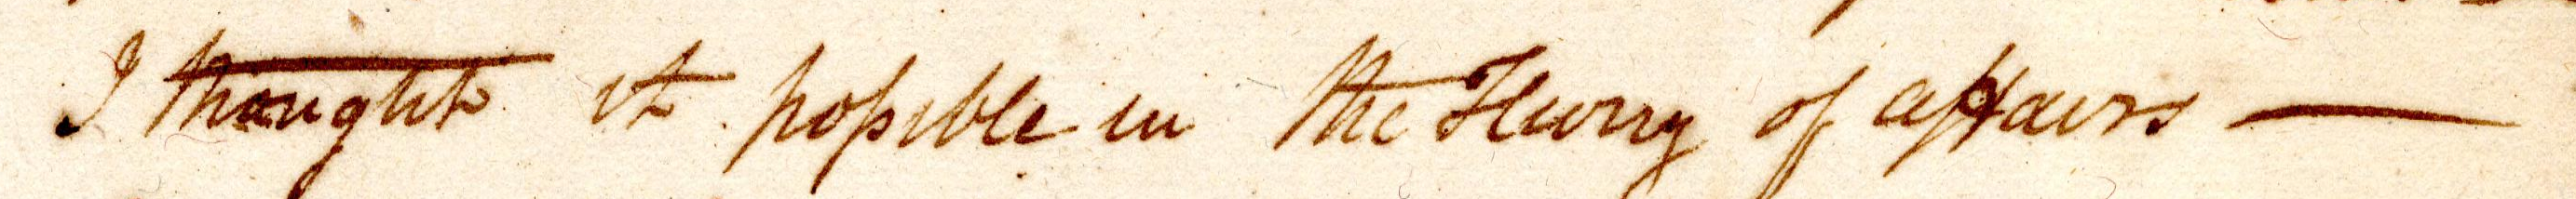I thought it possible in the Hurry of affairs
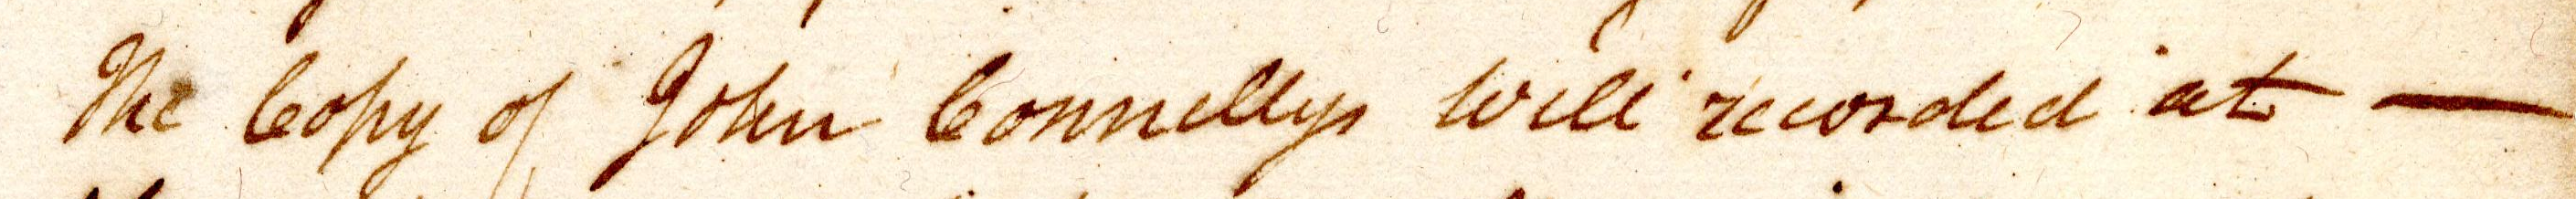the Copy of John Connellys will recorded at
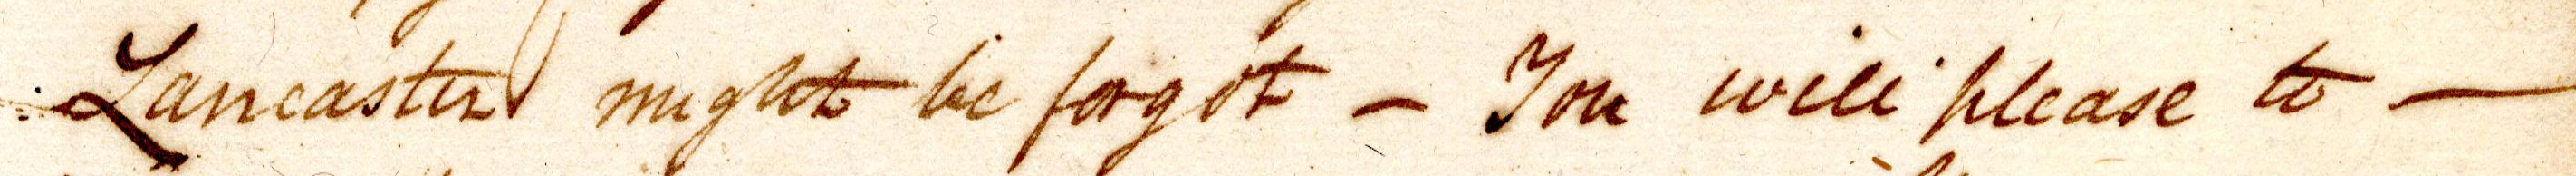Lancaster might be forgot. You will please to
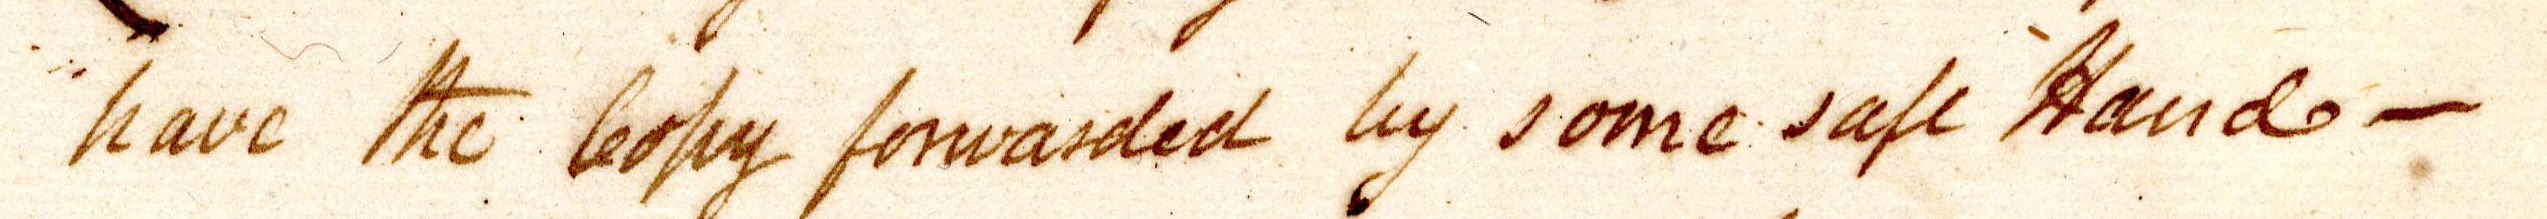have the Copy forwarded by some safe Hand.
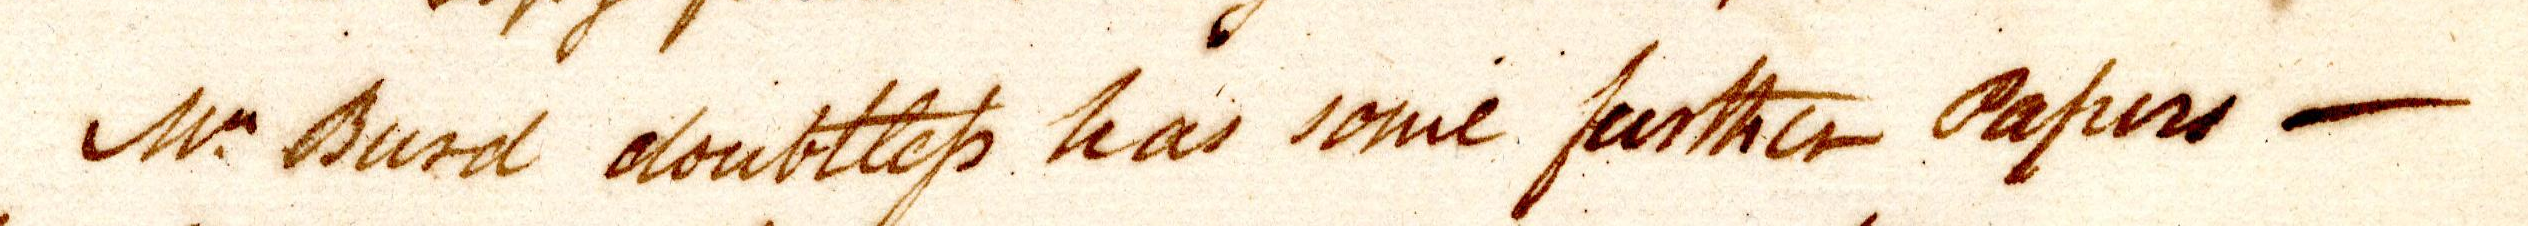M^r. Burd doubtless has some further Papers
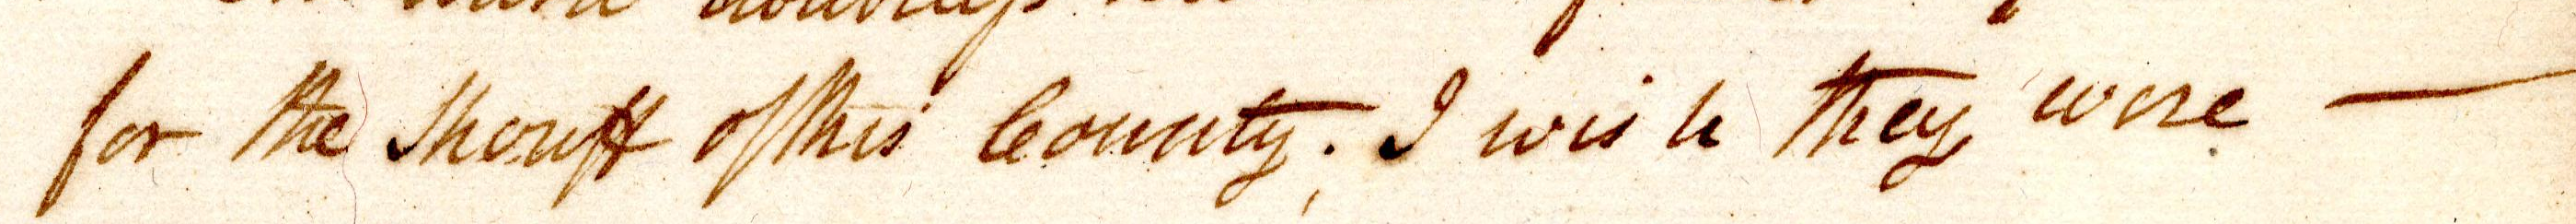for the Sheriff of this County. I wish they were
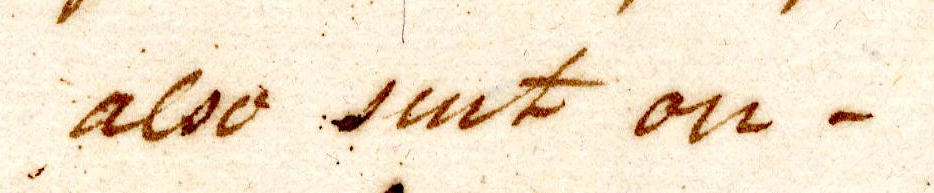also sent on.
